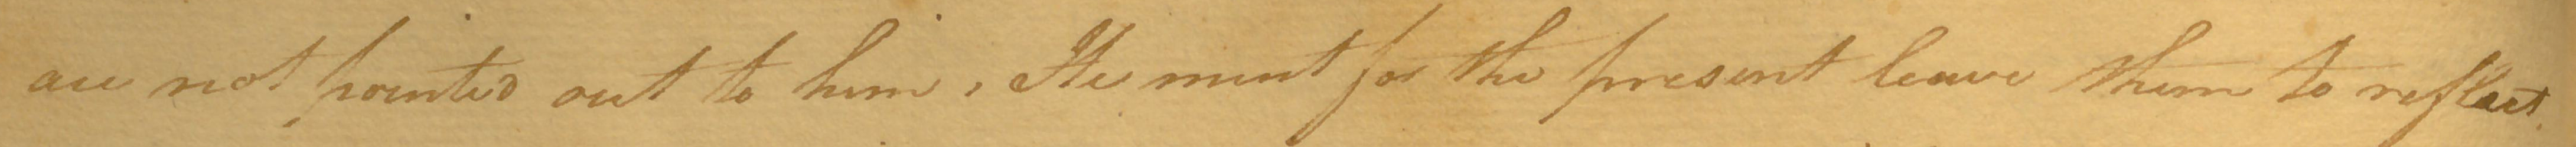are not pointed out to him, He must for the present leave them to reflect
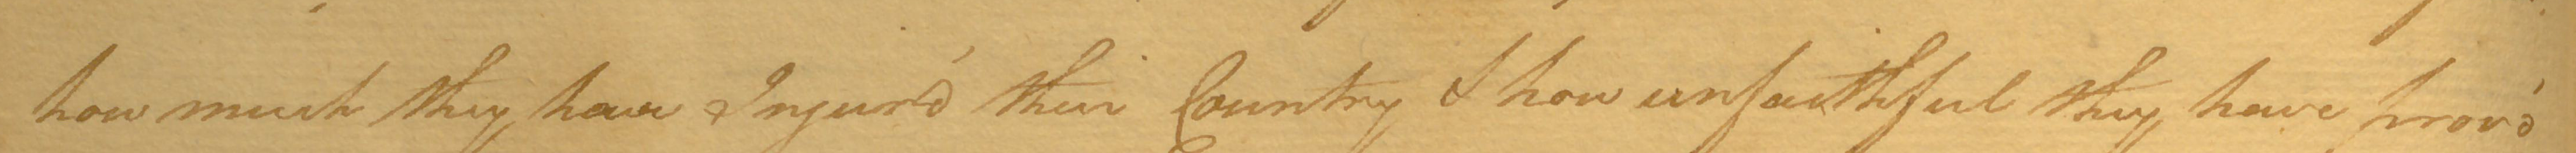how much they have Injur'd their Country & how unfaithful they have prov'd
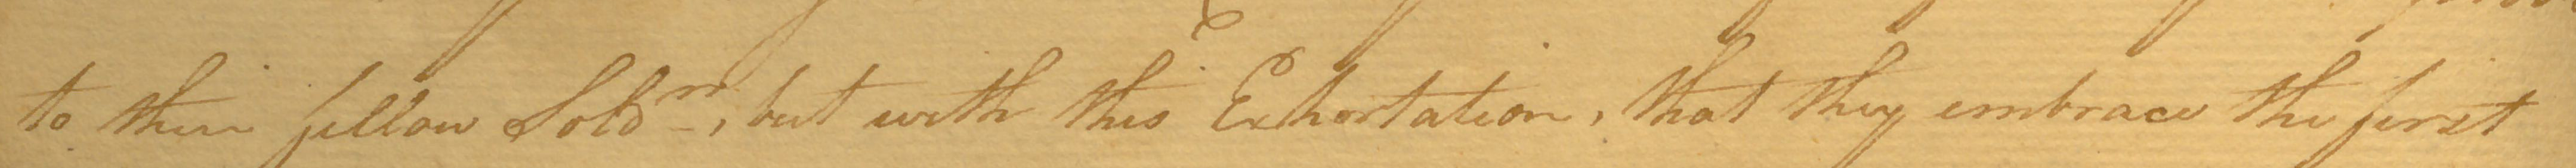to their fellow Sold^rs, but with this Exhortation, that they embrace the first
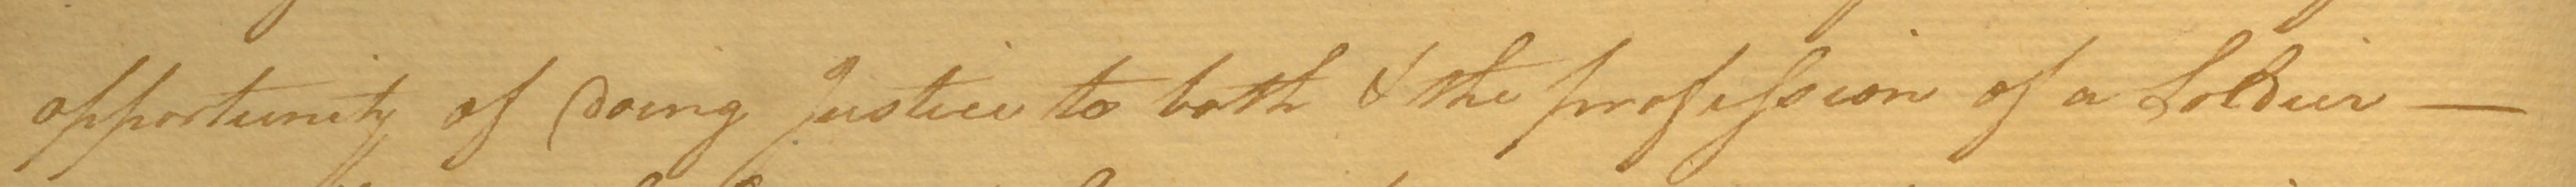opportunity of doing Justice to both & the profession of a Soldier-
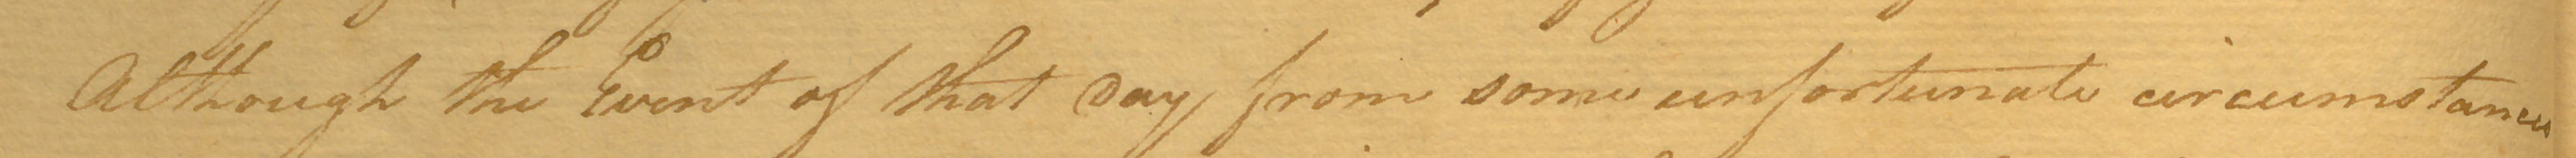Although the Event of that day from some unfortunate circumstances
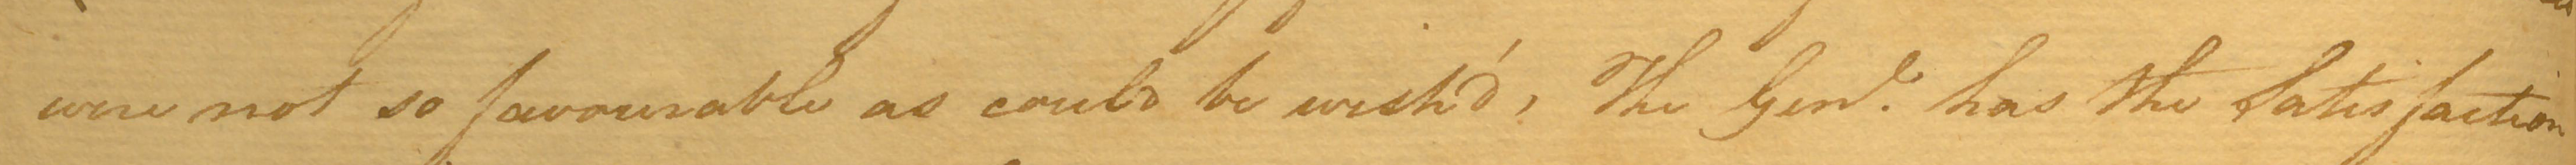were not so favourable as could be wish'd, The Gen^l. has the Satisfaction
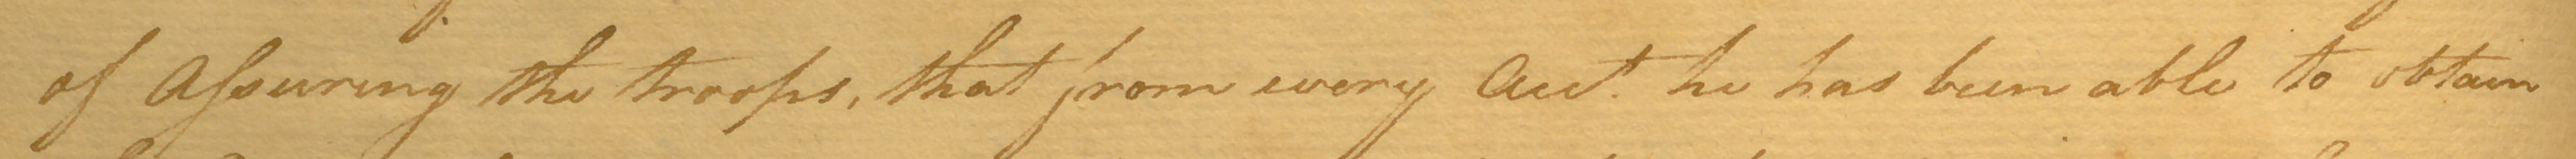of Assuring the troops, that from every Acc^t. he has been able to obtain
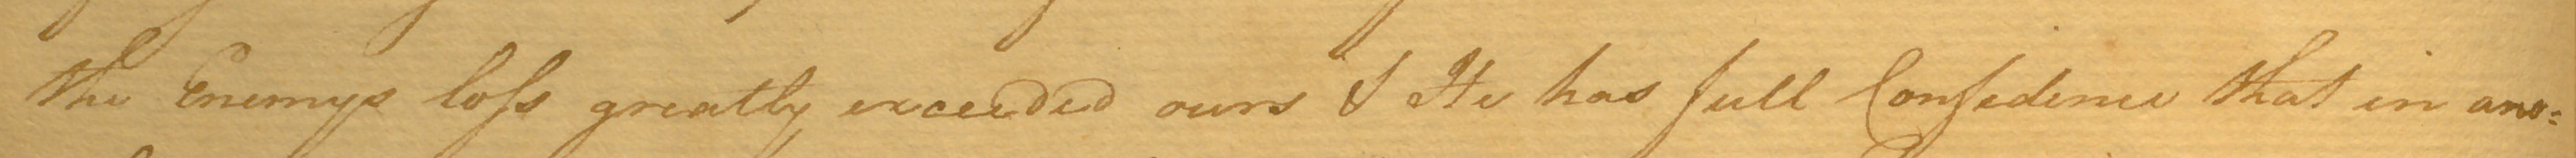the Enemys loss greatly exceeded ours & He has full Confidence that in ano-
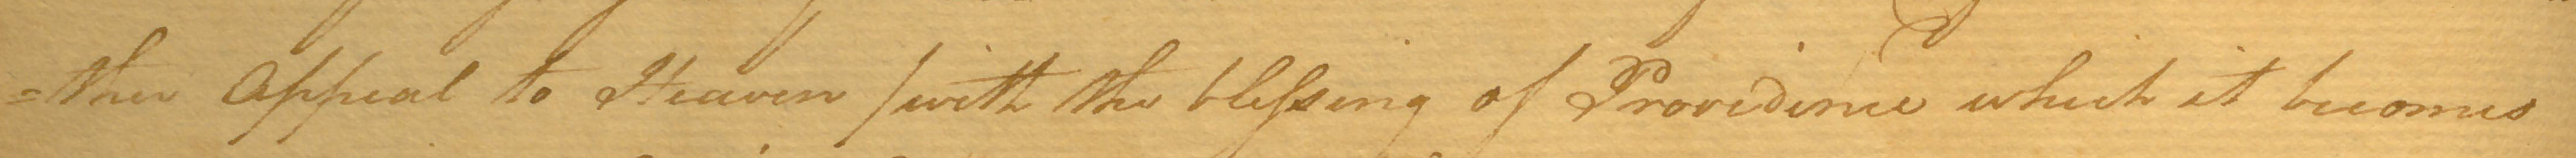-ther Appeal to Heave /with the blessing of Providence which it becomes
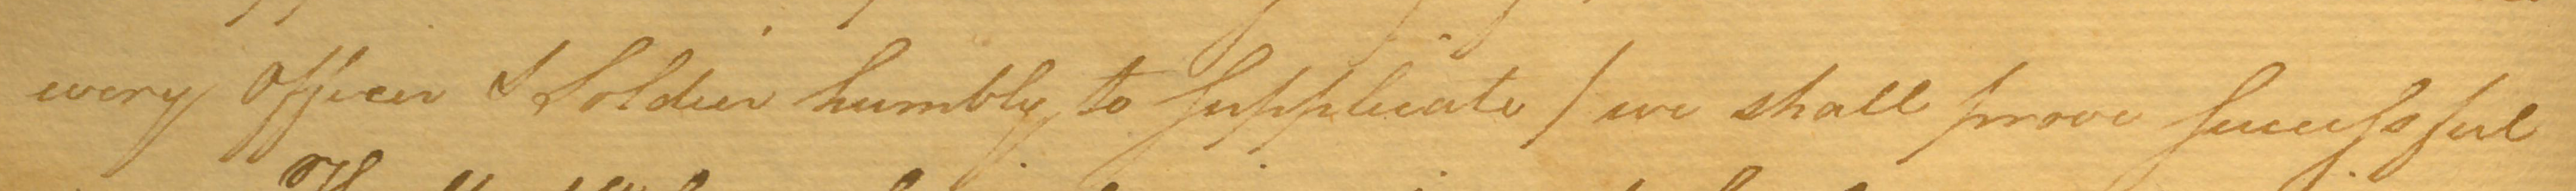every Officer & Soldier humbly to supplicate/ we shall prove successful
